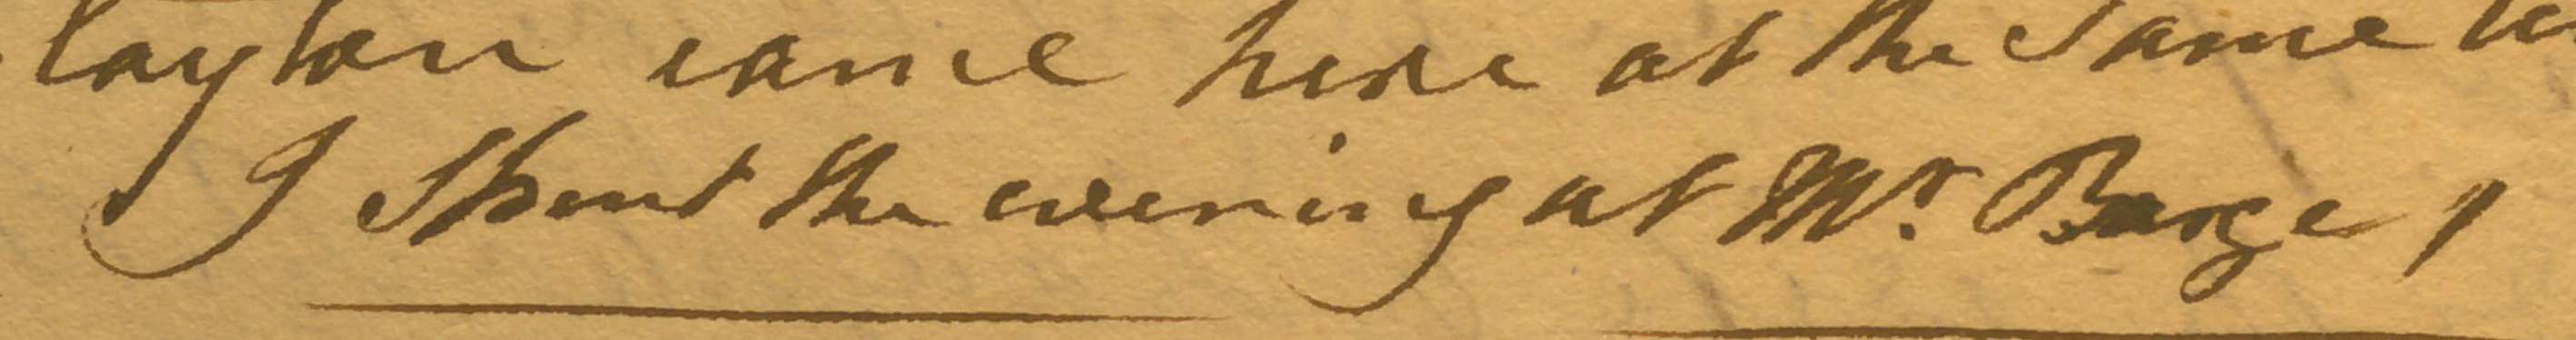I spent the evening at M^r. Barges
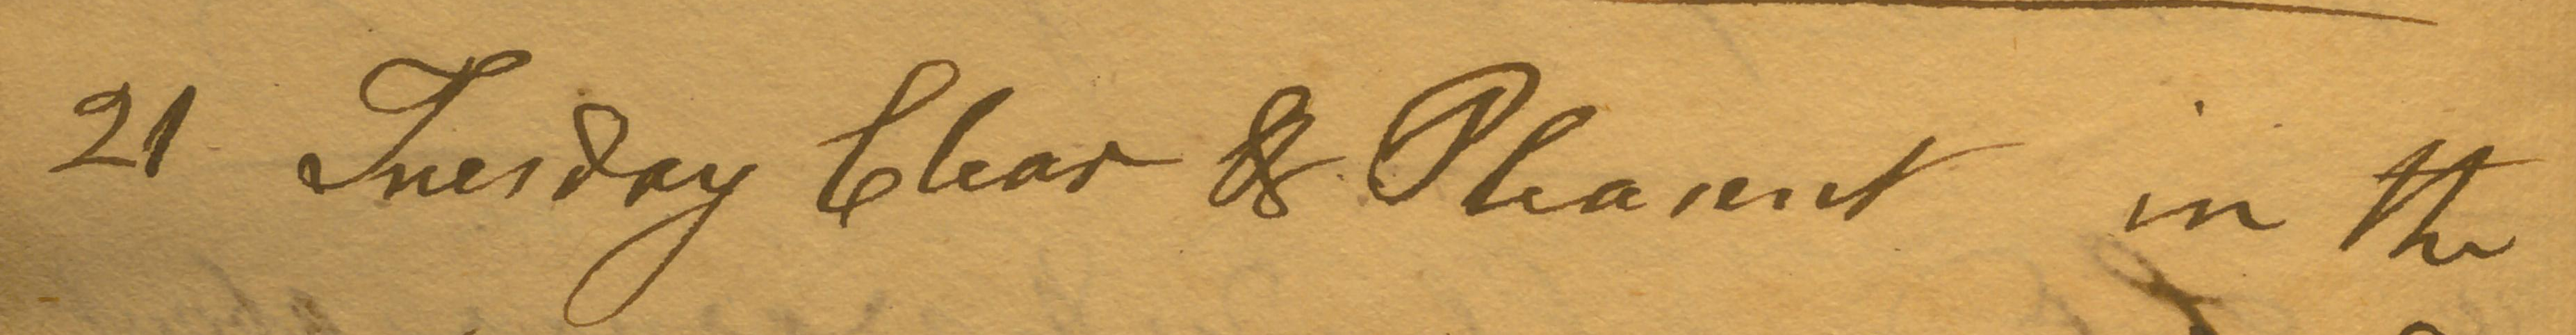21 Tuesday Clear & Pleasent in the
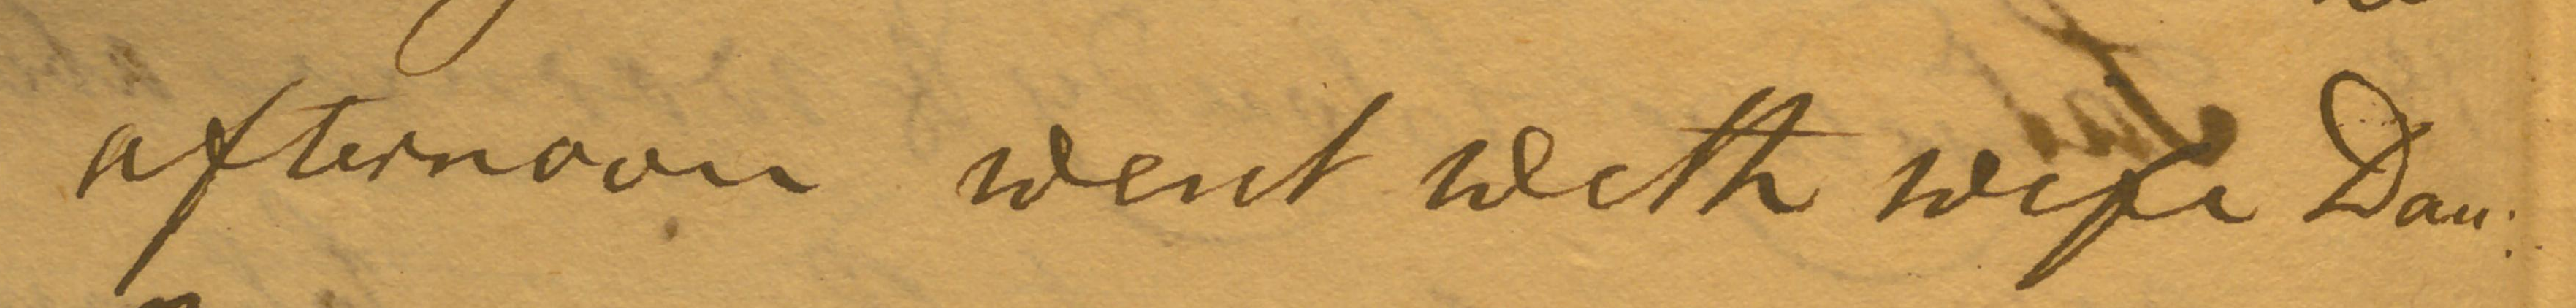afternoon went with wife Dau
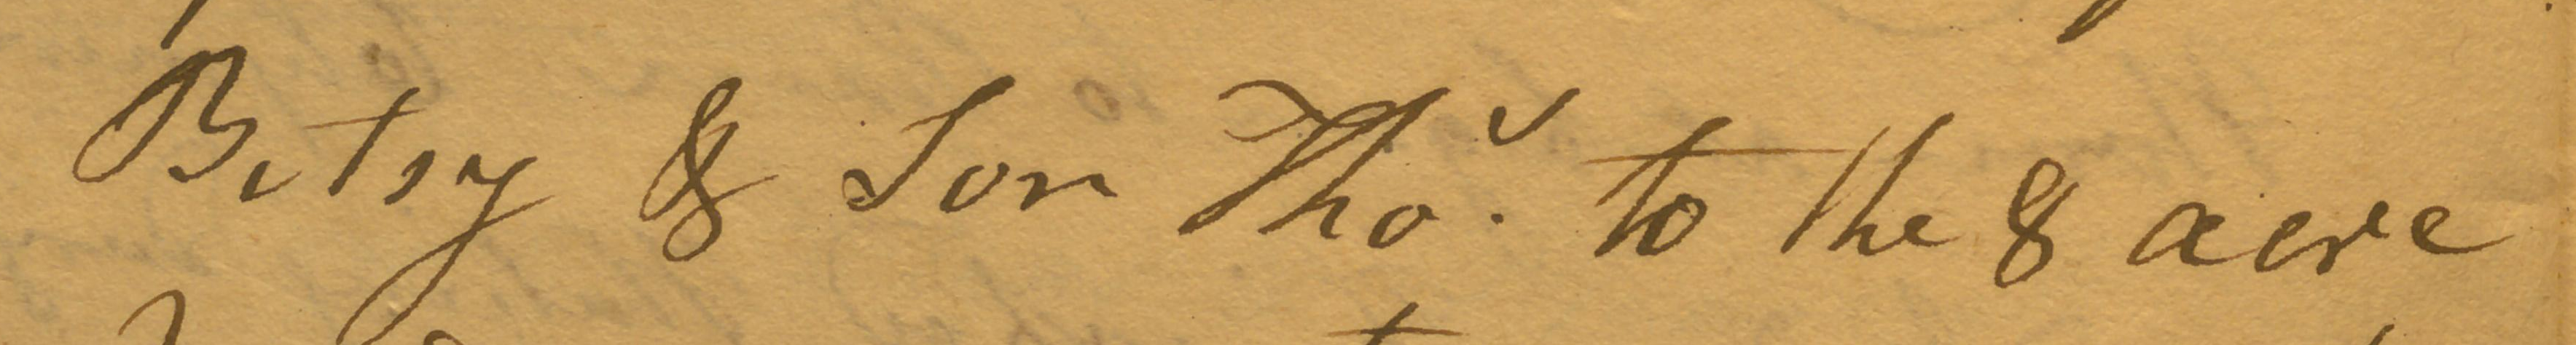Betsy & Son Tho^s. to the 8 acre
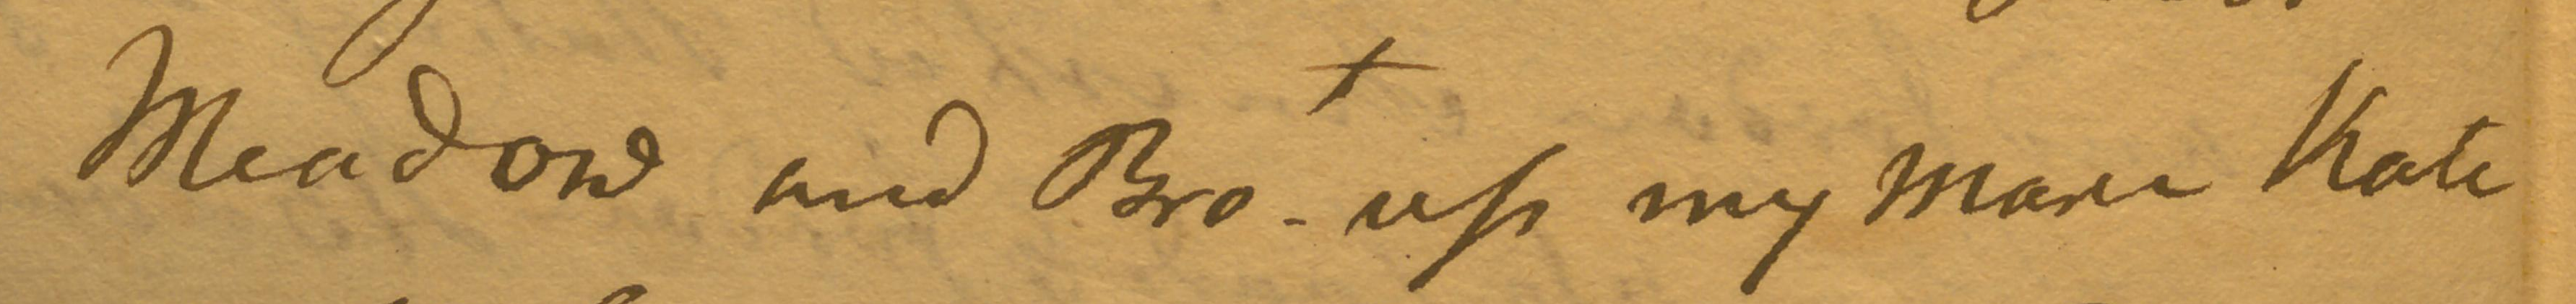Meadow and Bro^t. up my mare Kate
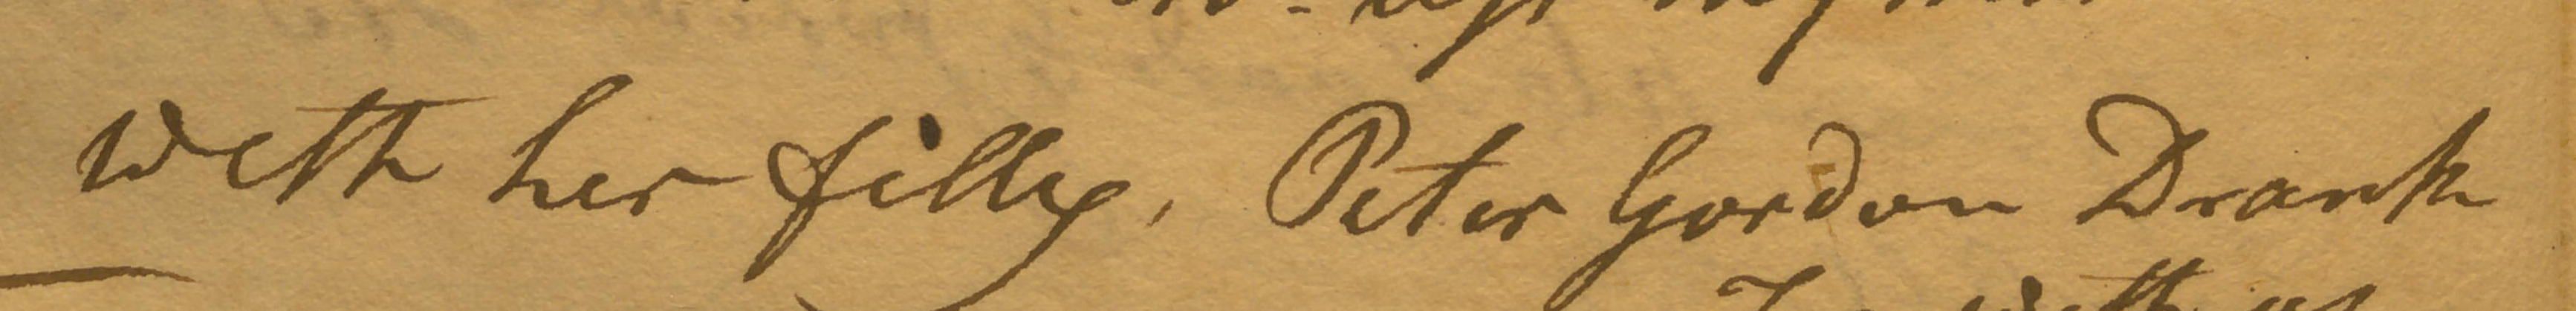with her filly, Peter Gordon Drank
